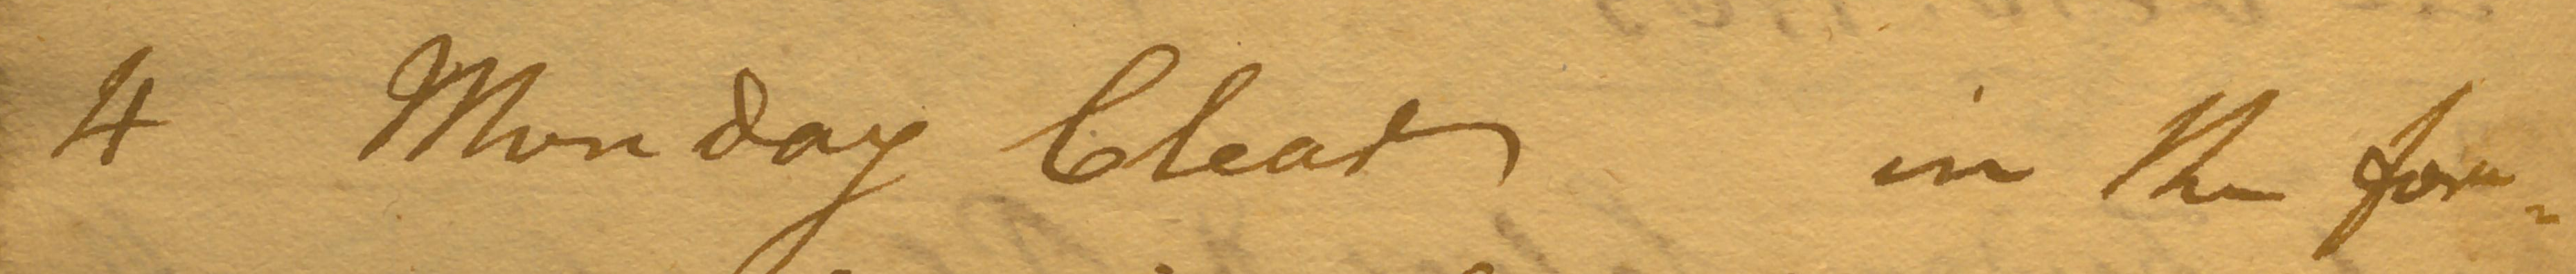4 Monday Clear in the for
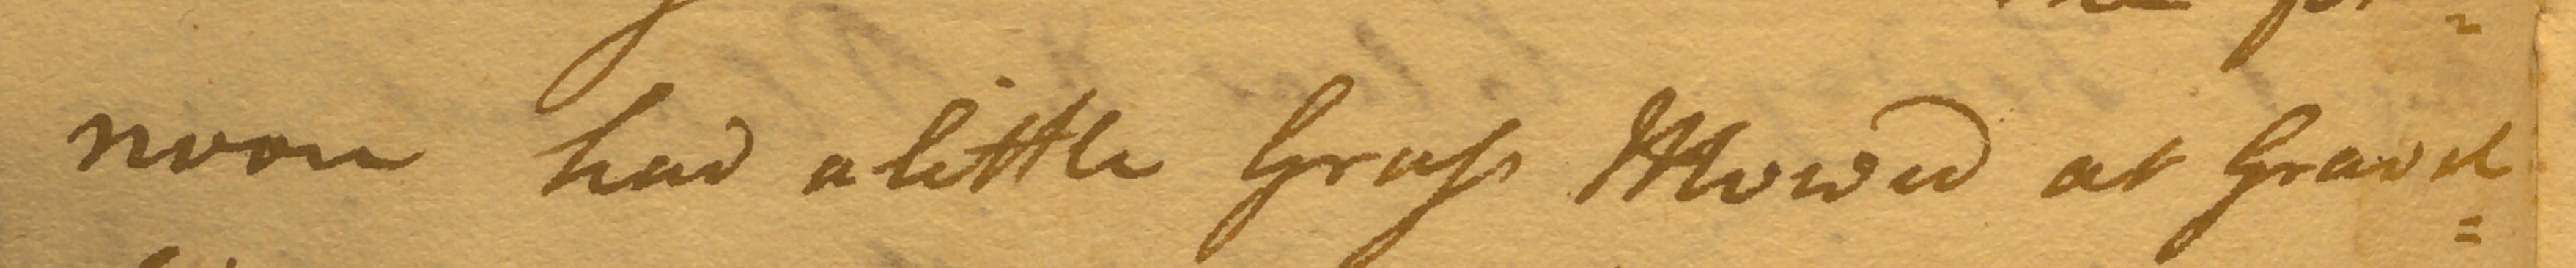noon had a little Grass Mowed at Gravel
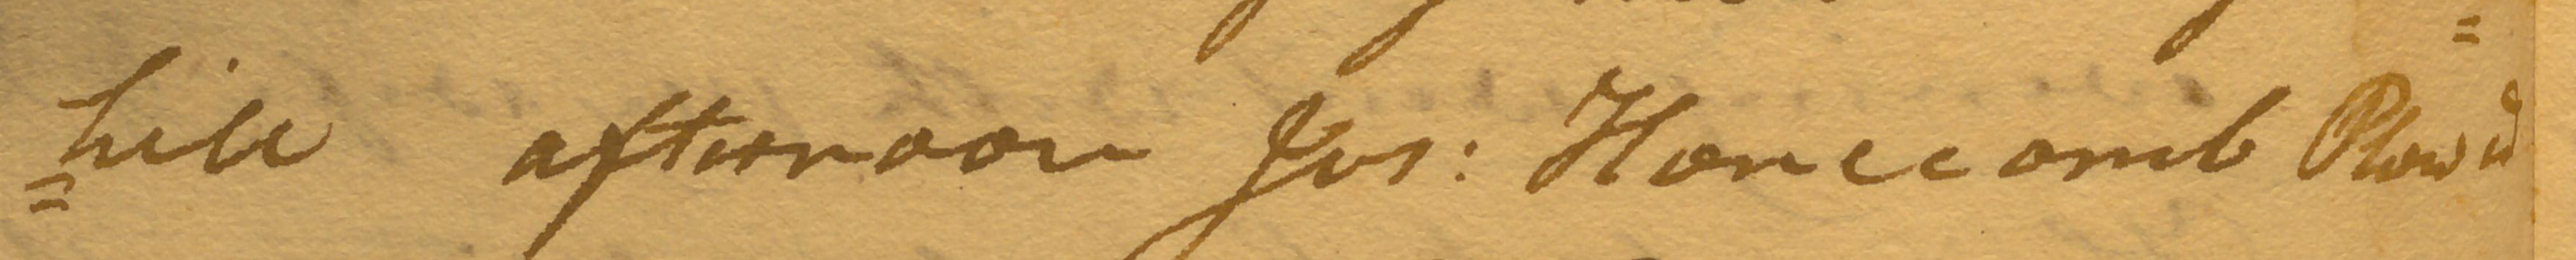hill afternoon Jos: Honecomb Plowed
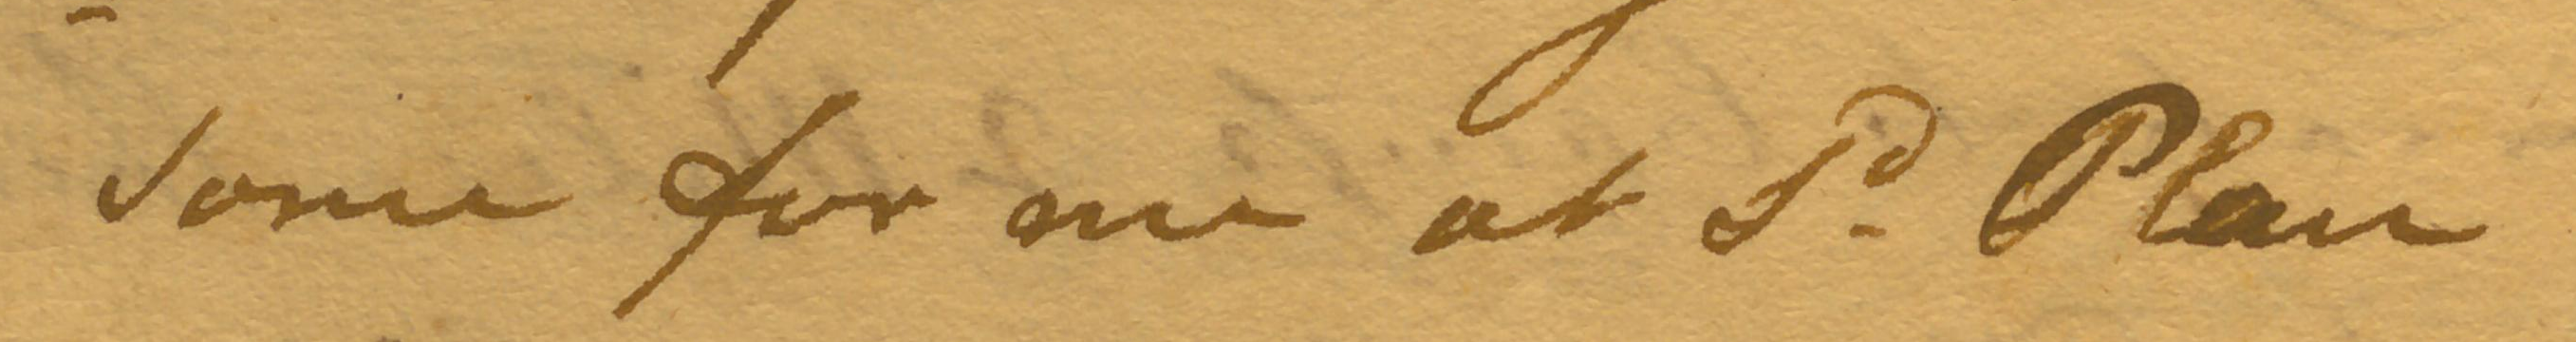some for me at s^d. Plan
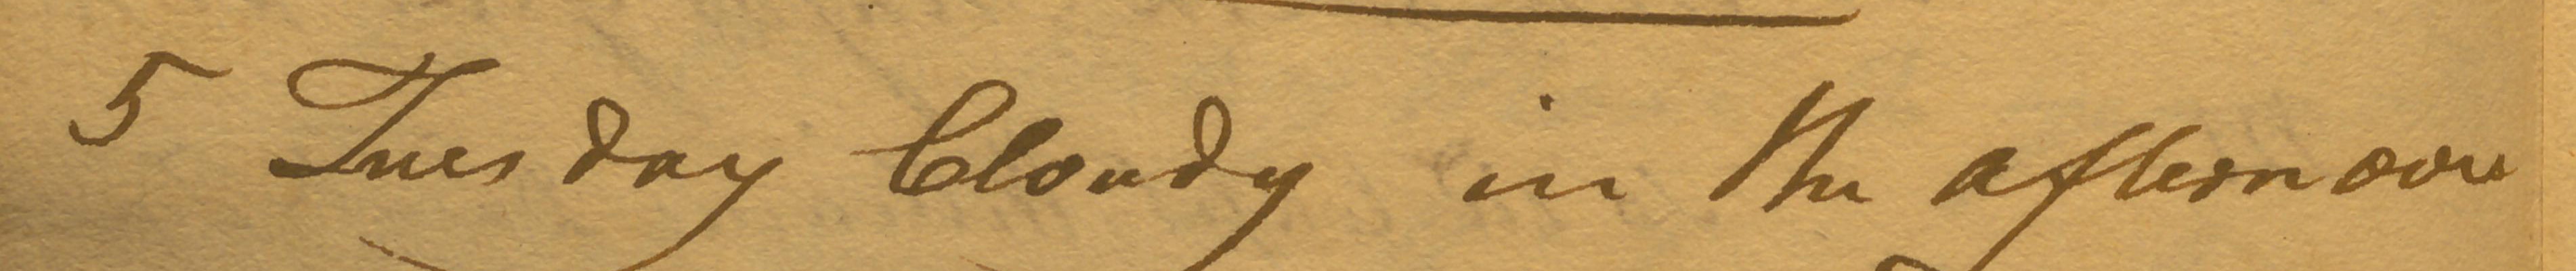5 Tuesday Cloudy in the afternoon
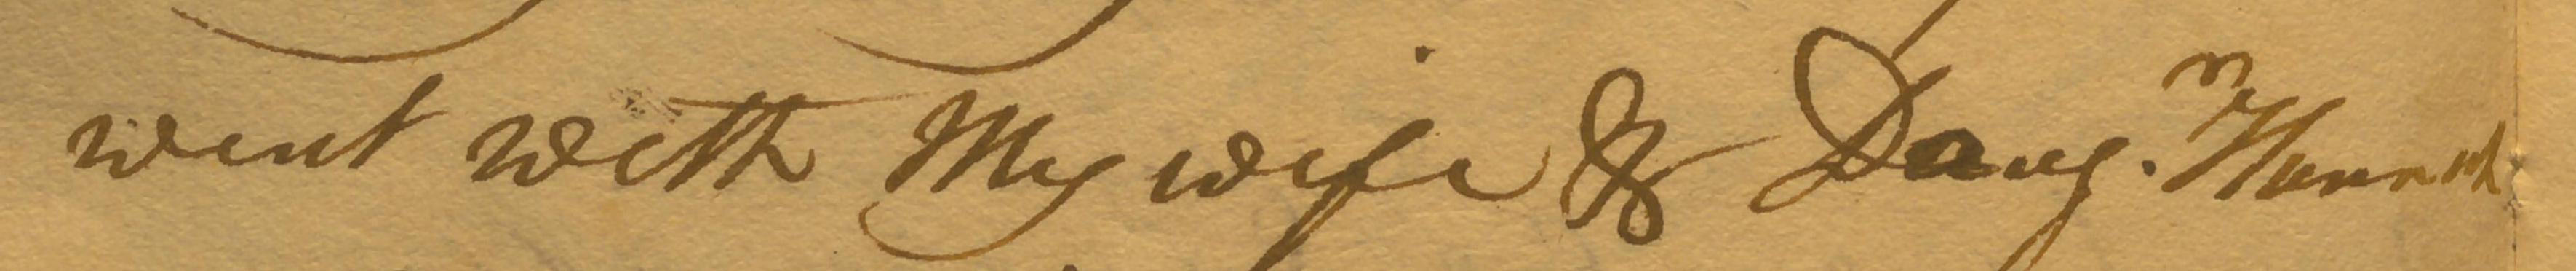went with My wife & Daug^r. Hannah
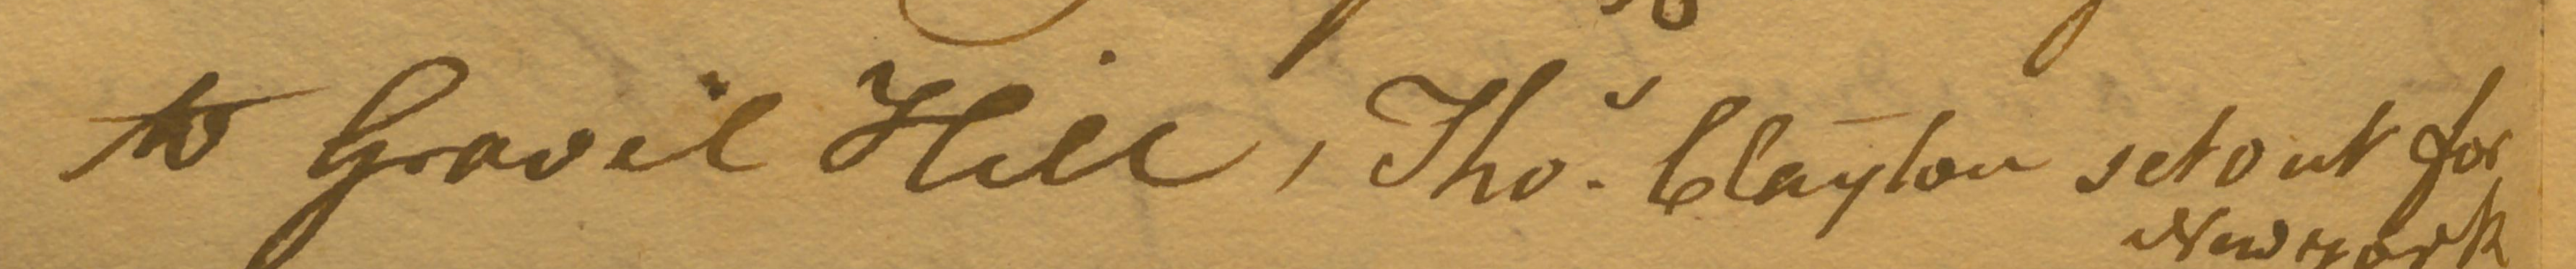Gravel Hill, Tho^s. Clayton set out for
